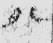八
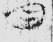月
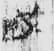戊
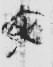寅
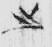之
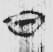日
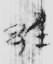邸
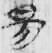昜（陽）
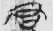君
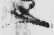之
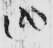州
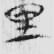里
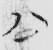公
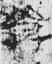登
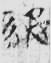○（纓）
